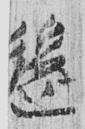○（後）
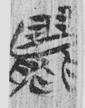○（抑）
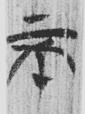不
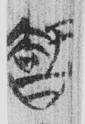智（知）
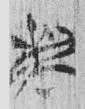民
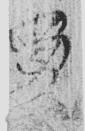○（務）
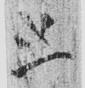之
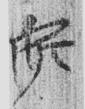𡚦（焉）
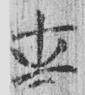才（在）
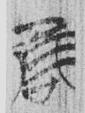唯
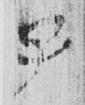子
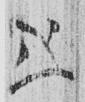之
